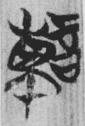諫
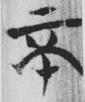不
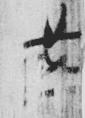城（成）
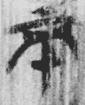不
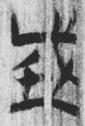城（成）
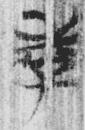孝
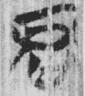君
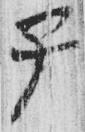子
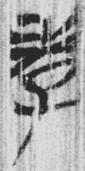孝
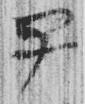子
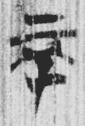不
